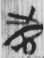志
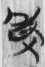事
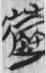速
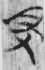○（得）
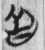皆
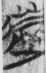速
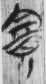賽
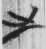之
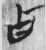占
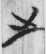之
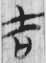吉
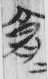月亯
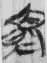○（夏）
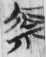○（夕）
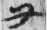又
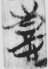憙（喜）
